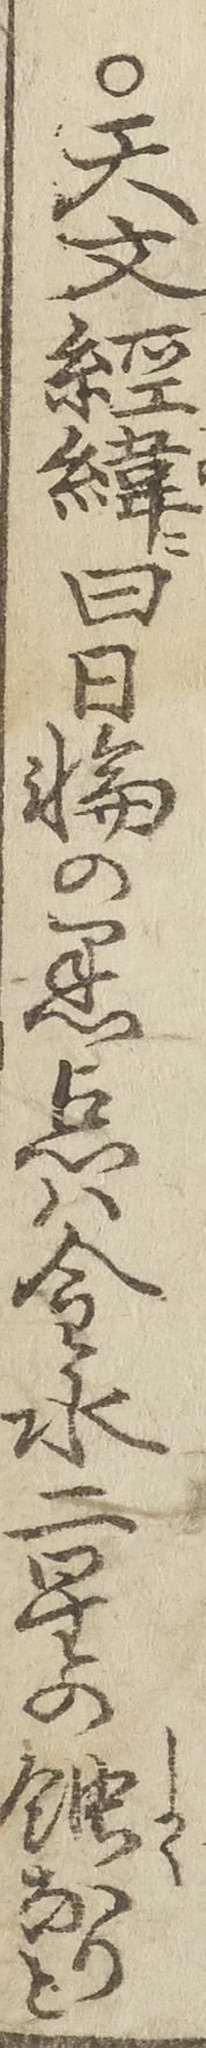○天文経緯ニ曰日輪の黒点は金水二星の蝕なりと

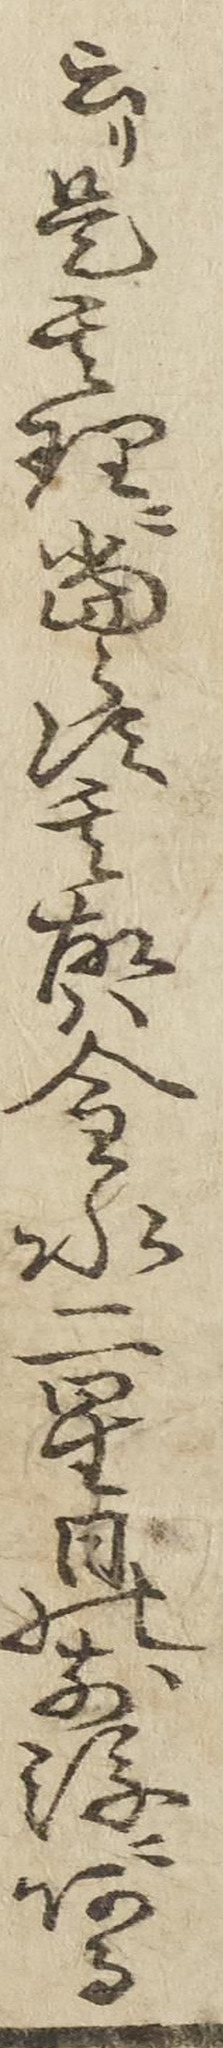云リ是其理ニ当らす其故は金水二星日の前後ニある
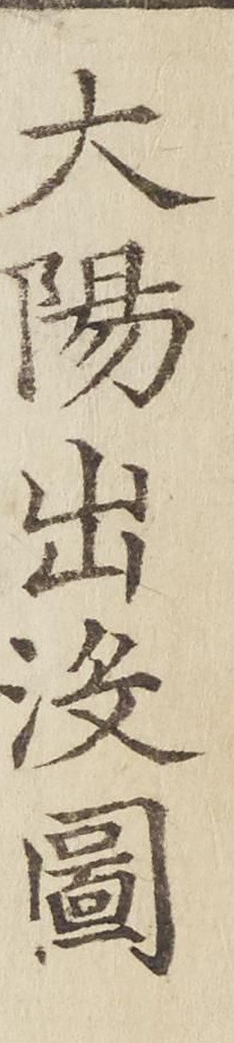大陽出没図
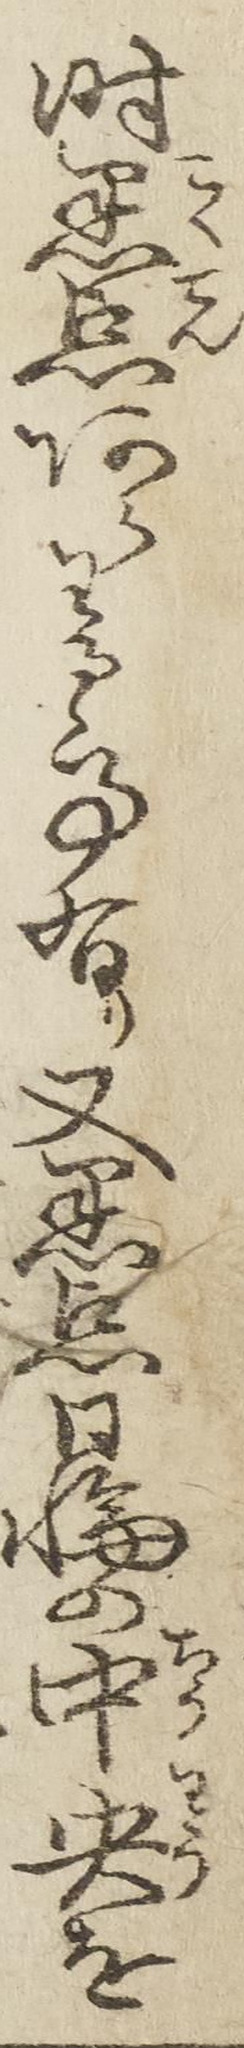時黒点あらわるゝ事有リ又黒点日輪の中央を
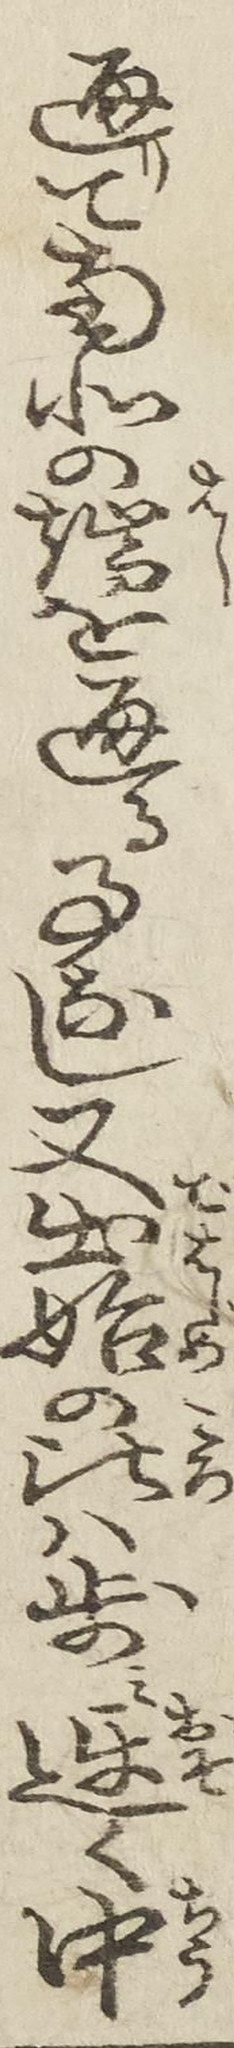通リて南北の端を通る事なし又出始の比は歩ミ遅く中
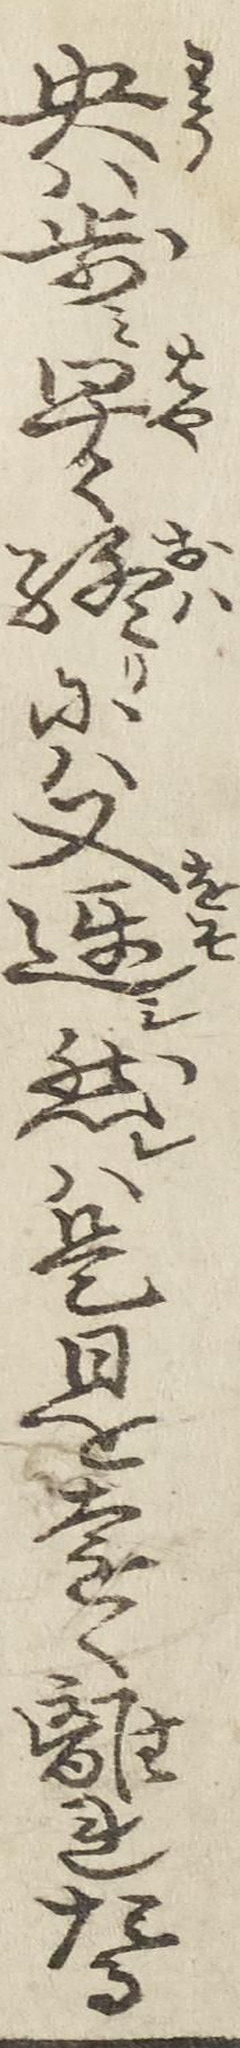央は歩ミ早く終リには又遅シ然レは是日を遠く離れたる
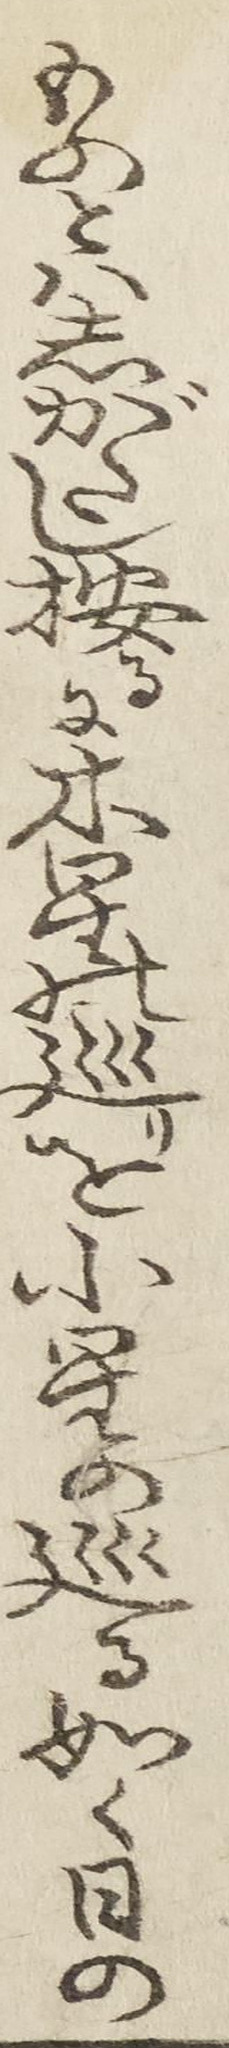ものとはしがたし按るに木星の巡リを小星の巡る如く日の
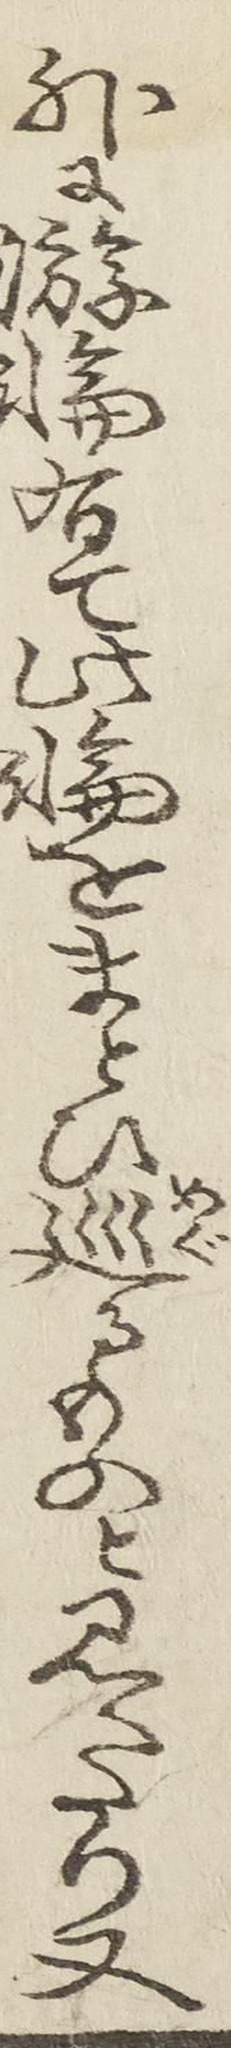外に游輪有て此輪をまとひ巡るものと見へたり又
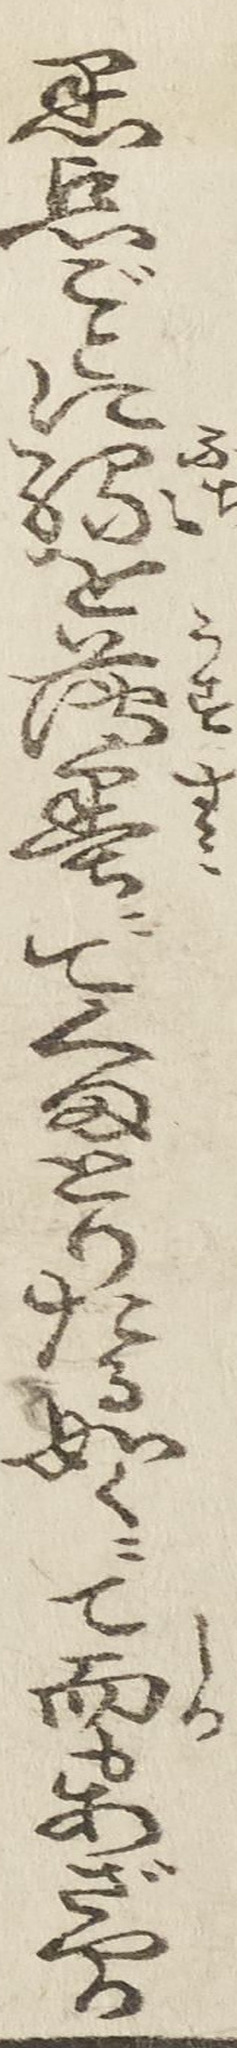黒点ごとに縁を薄墨ニてくまとりたる如くニて而もあざやか
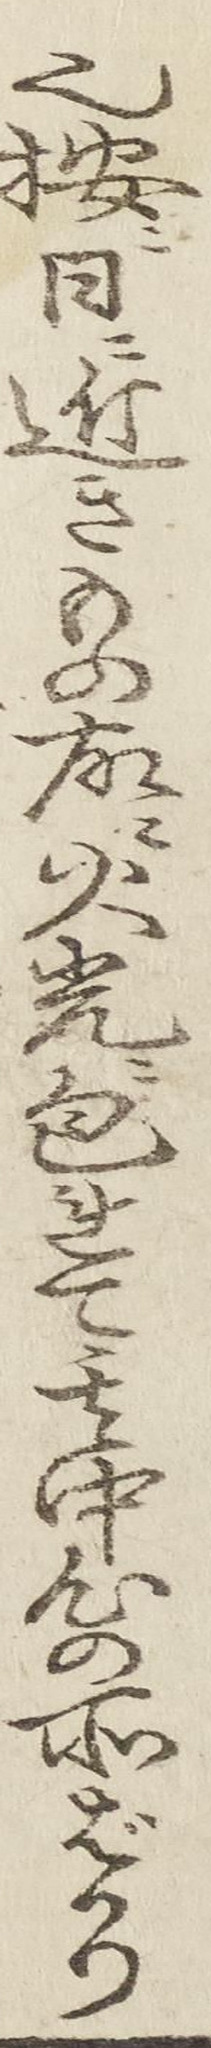也按ニ日ニ近きもの故ニ火光ニ包れて其中心の所ばかり
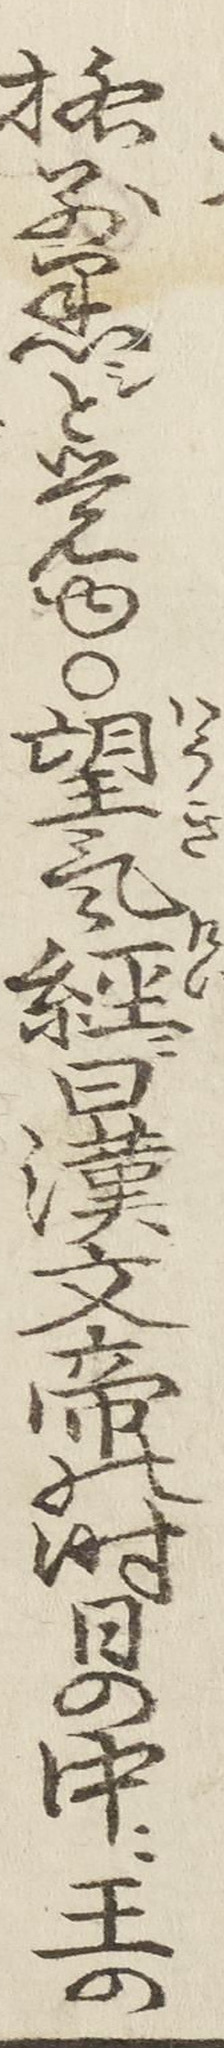格別黒シと覚ゆ○望気経ニ曰漢文帝の時日の中ニ王の
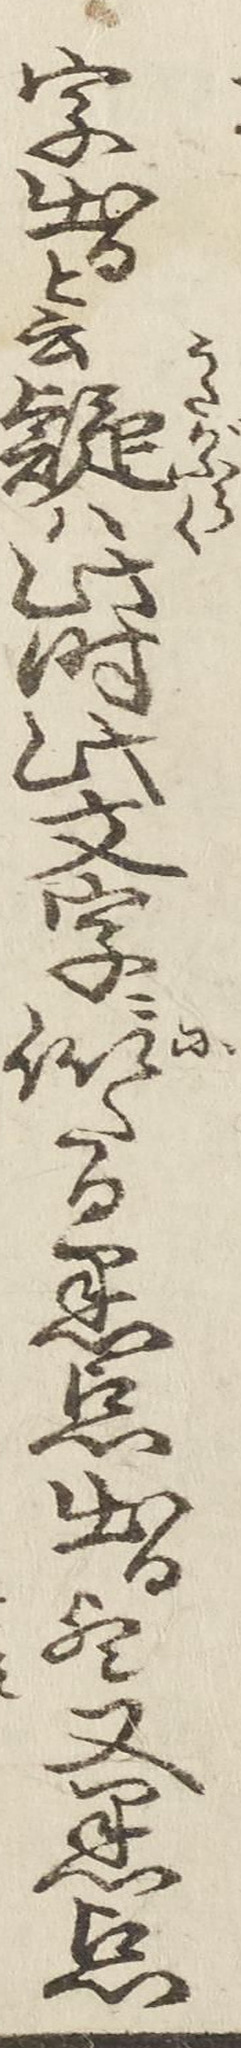字出ると云疑は此時此文字ニ似たる黒点出る歟又黒点
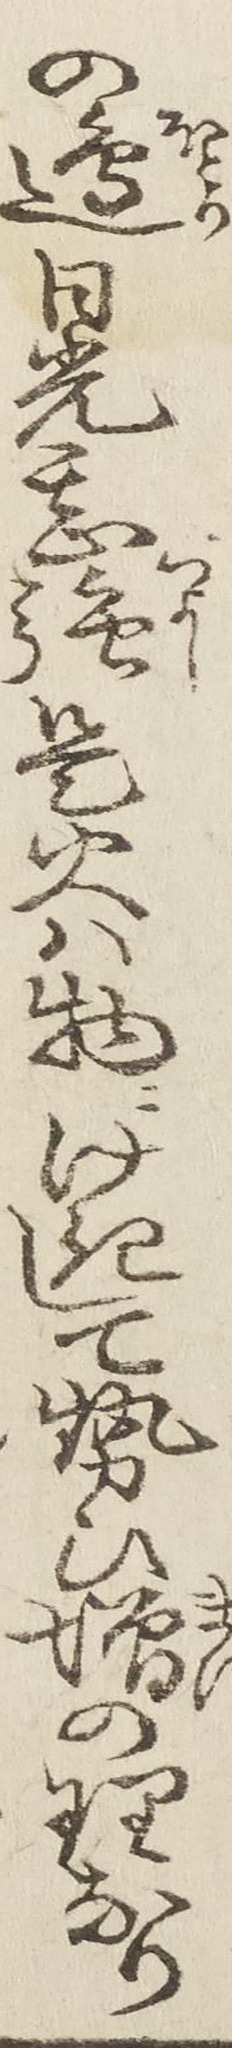の辺日光甚強是火は物ニけきして勢ひ増の理なり
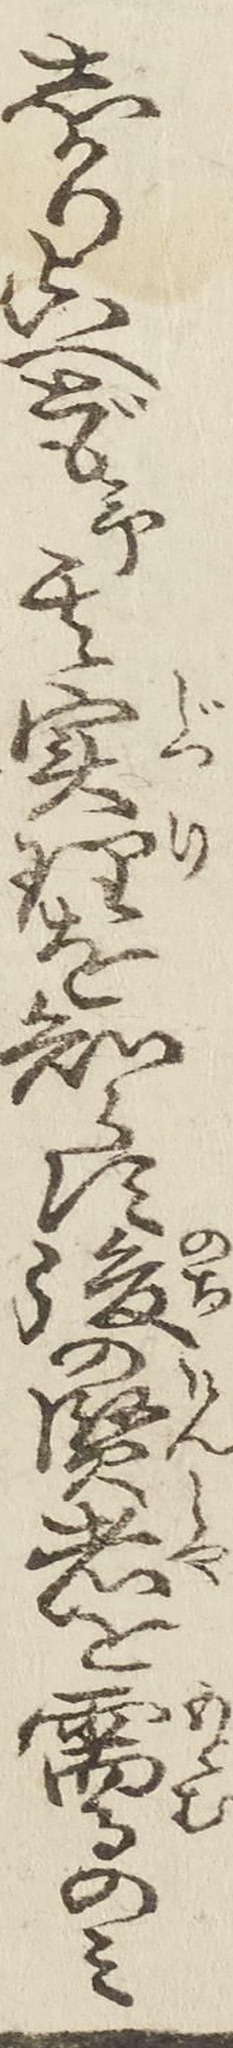しかりといへども予其実理を知らす後の賢者を需るのみ
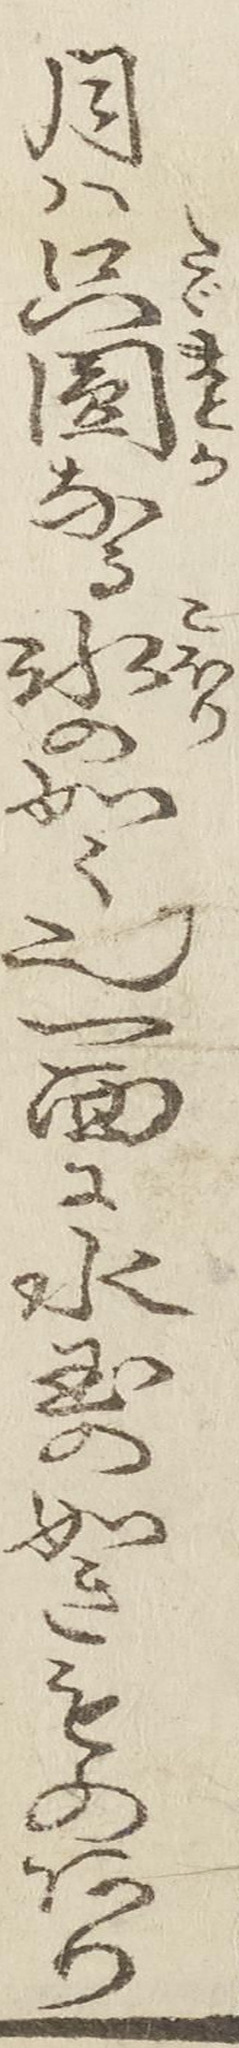月は只円なる氷の如く也一面に水玉の如きものあり
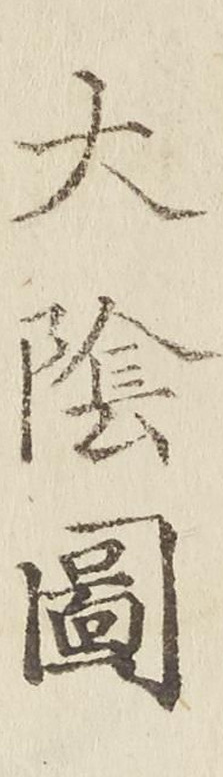大陰図
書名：平天儀圖解
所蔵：東京大学地震研究所図書室 Earthquake Research Institute Library, The University of Tokyo, JAPAN
